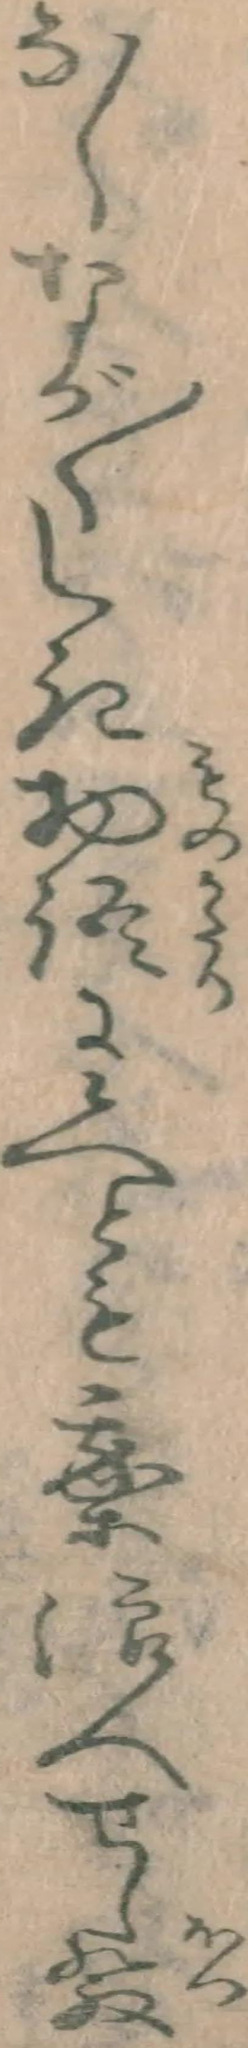なしなが〳〵しき物語に候へとも我等浪人せし発
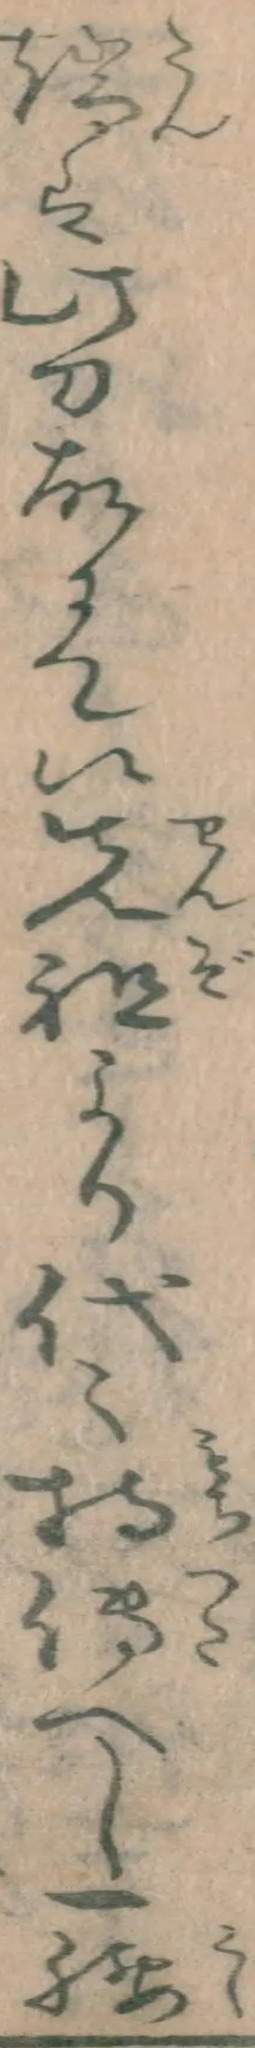端は此刀故にて候先祖より代々持伝へし一腰
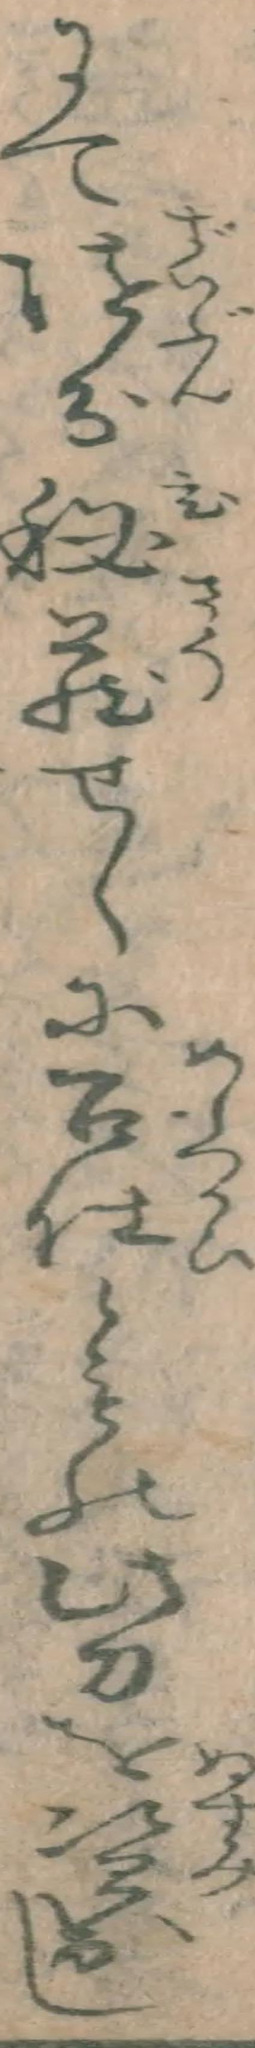にて随分秘蔵せしに召使ともの此刀を盗出し
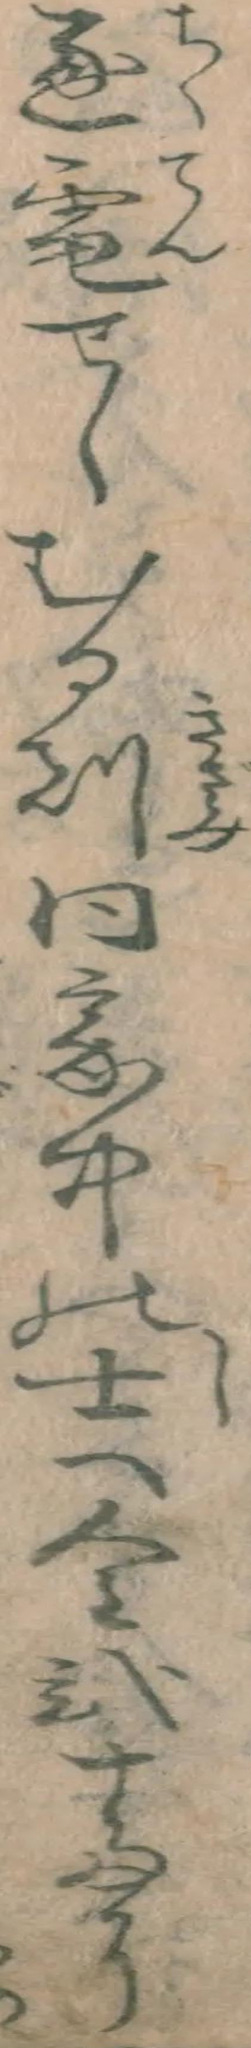逐電せしむる刻同家中の士へ金弐十両に
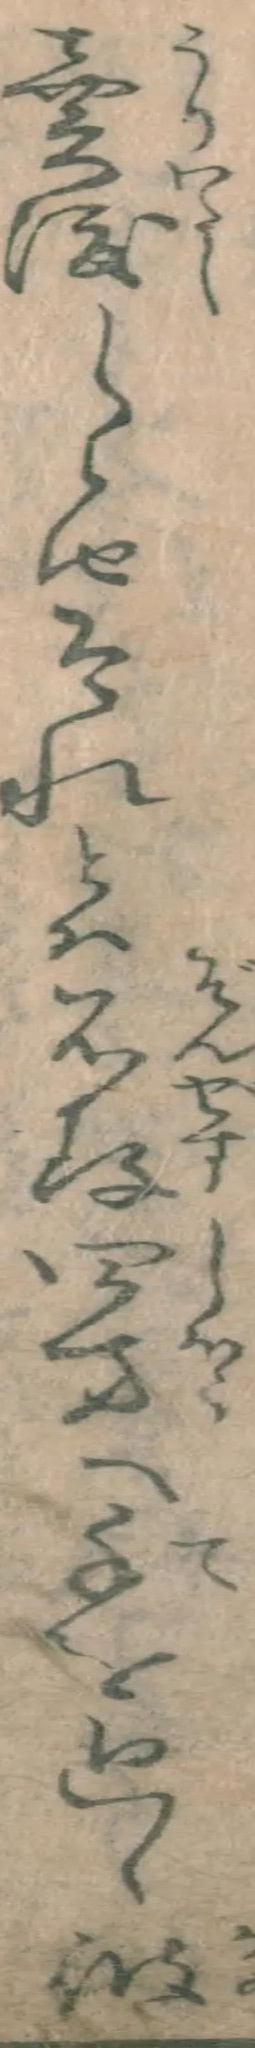売渡し候由それとは不存四方へ手を廻し彼
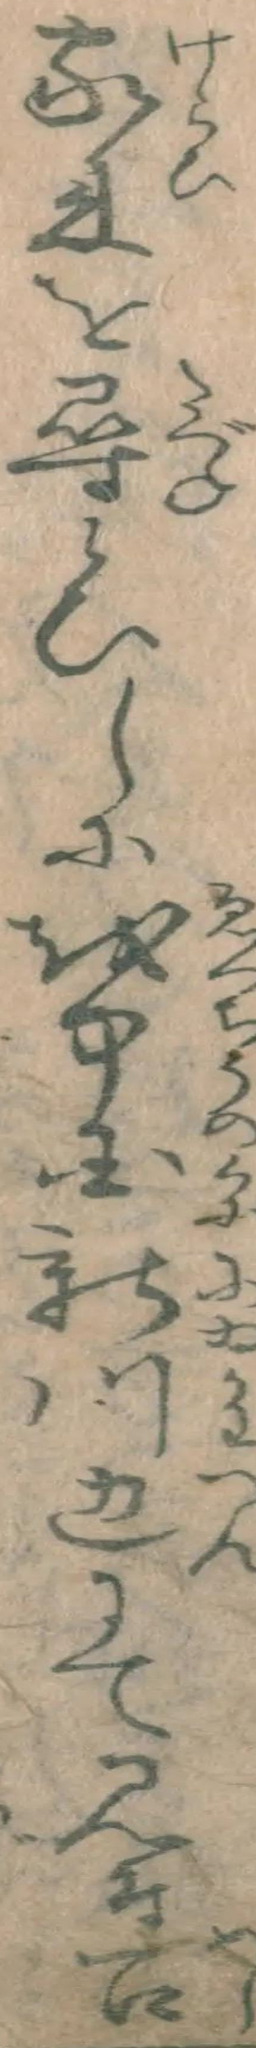家来を尋候ひしに越中国新川辺にて見付召
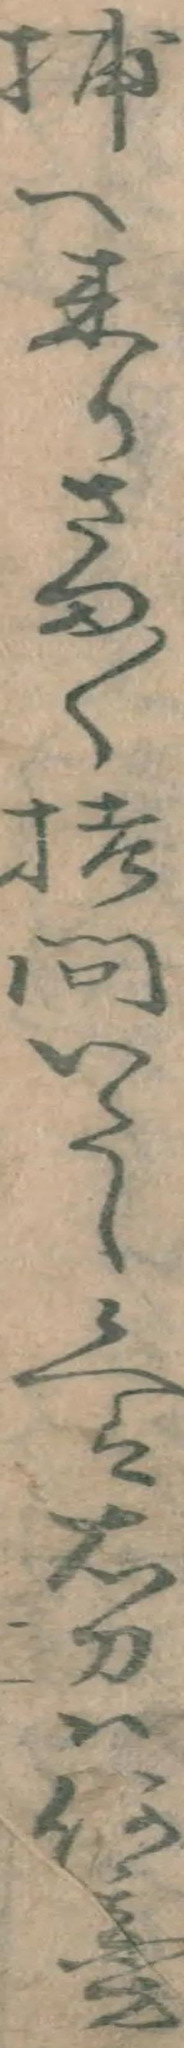捕へ来りさま〳〵拷問いたし候へは太刀は何某方

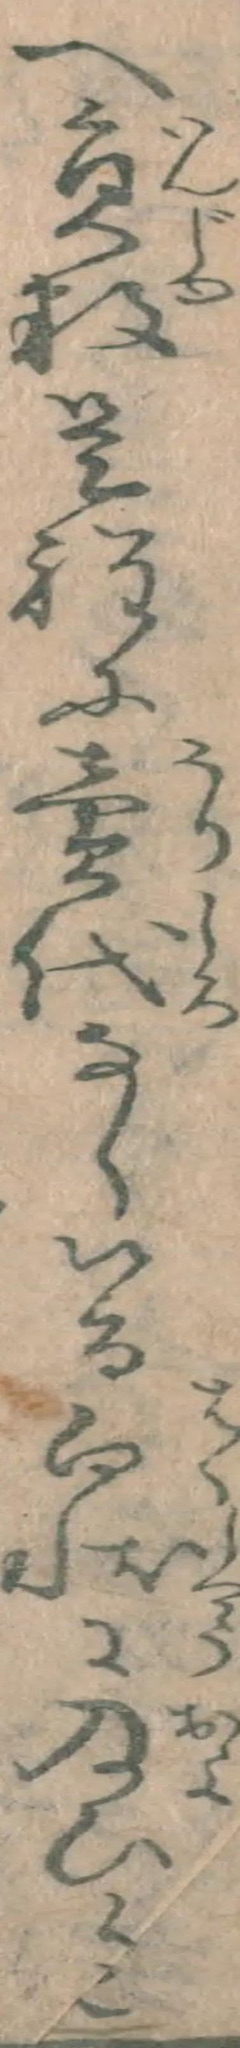へ員数是程に売代なし候旨白状に及ひ候こ
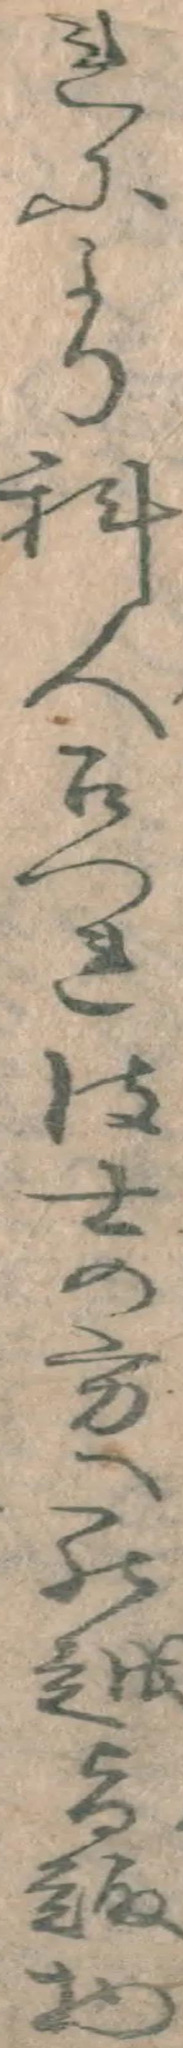れにより科人召つれ彼士の方へ罷越旨趣物
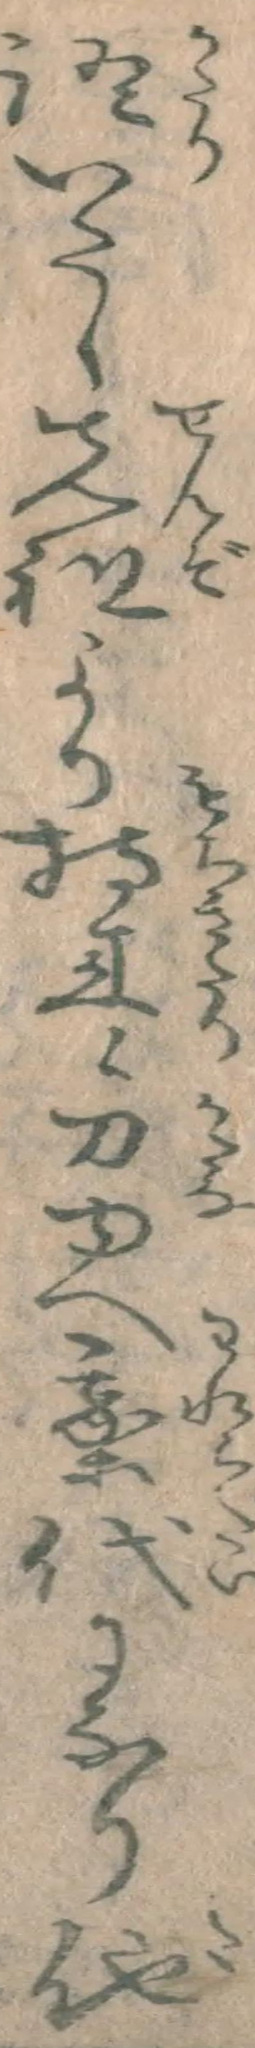語いたし先祖より持来候刀ゆへ我等代になり他
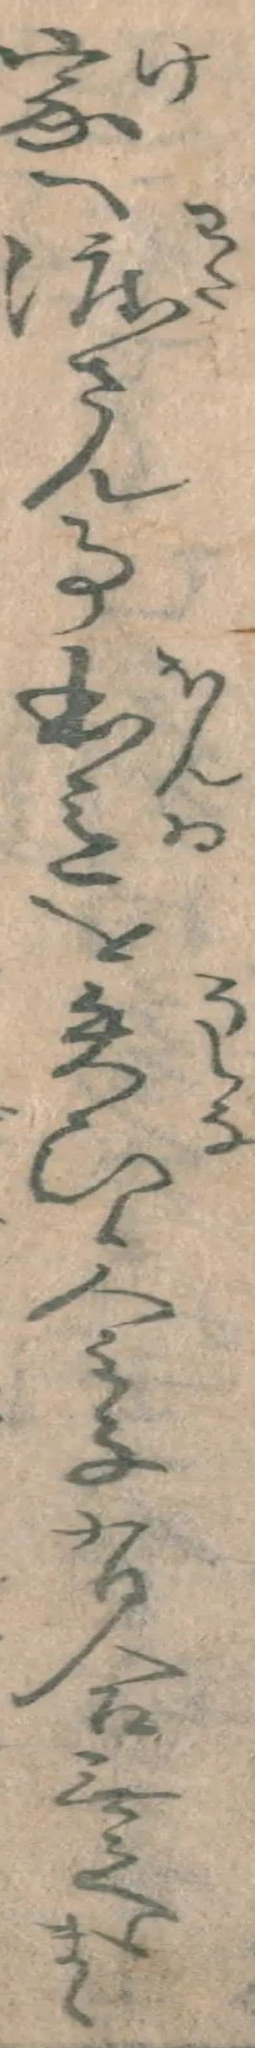家へ渡さん事本意を失ひ候金子有合無之候まゝ
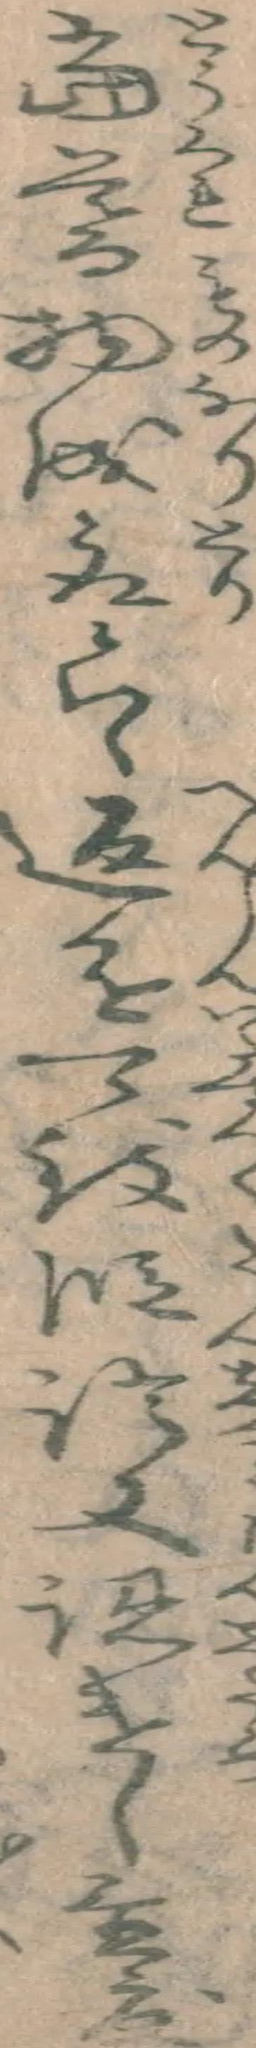当暮物成取候はゝ返進可致段証文認遣し置度
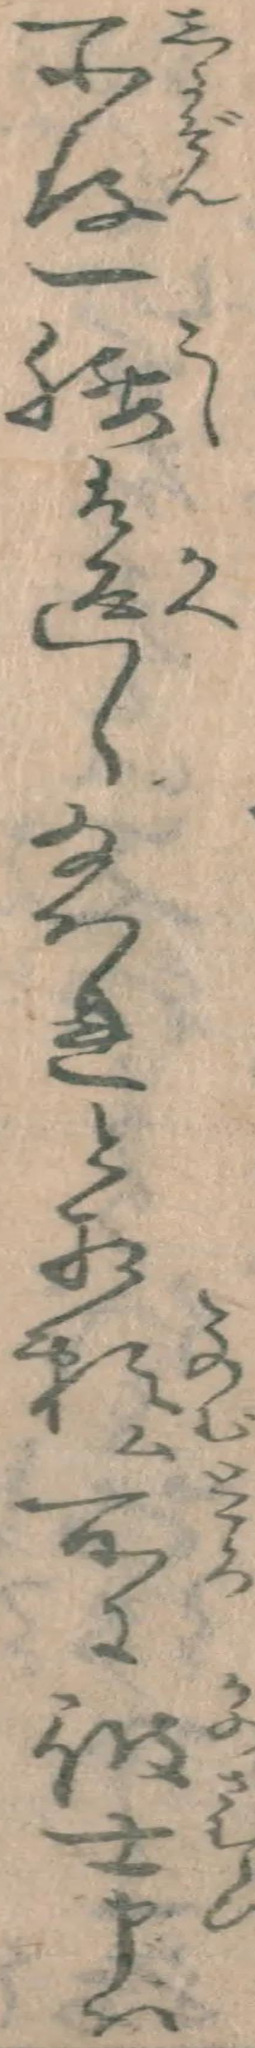所存一腰は返し給はれと相頼所に彼士申は
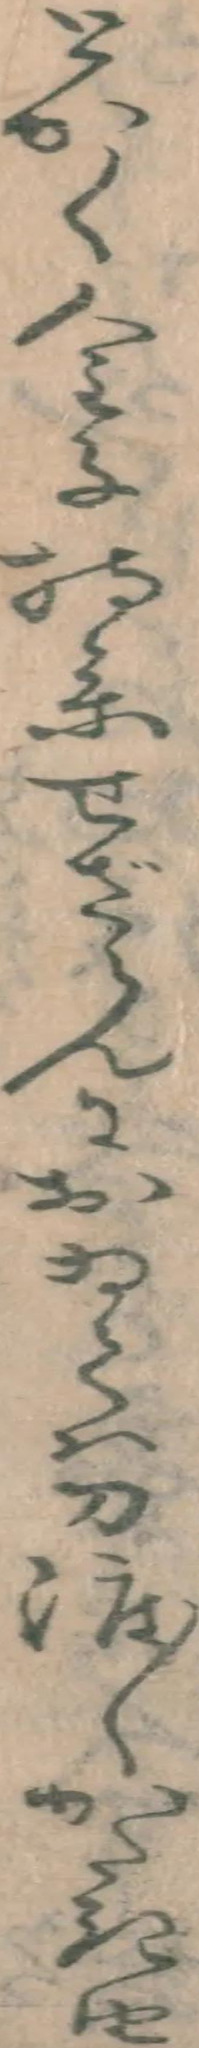とかく金子持参せざらんにおゐては刀渡しかたき由
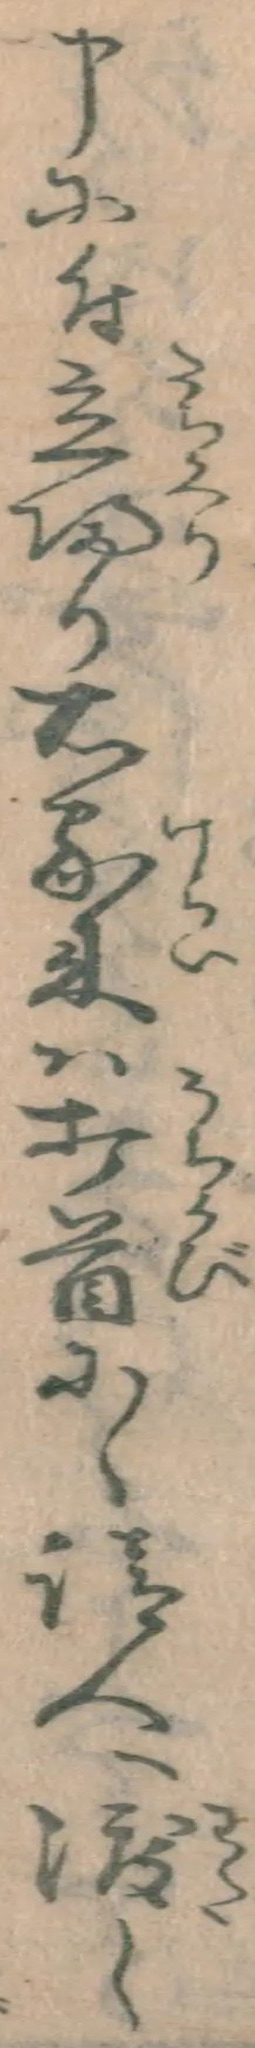申に付立帰り右家来は打首にし請人へ渡し
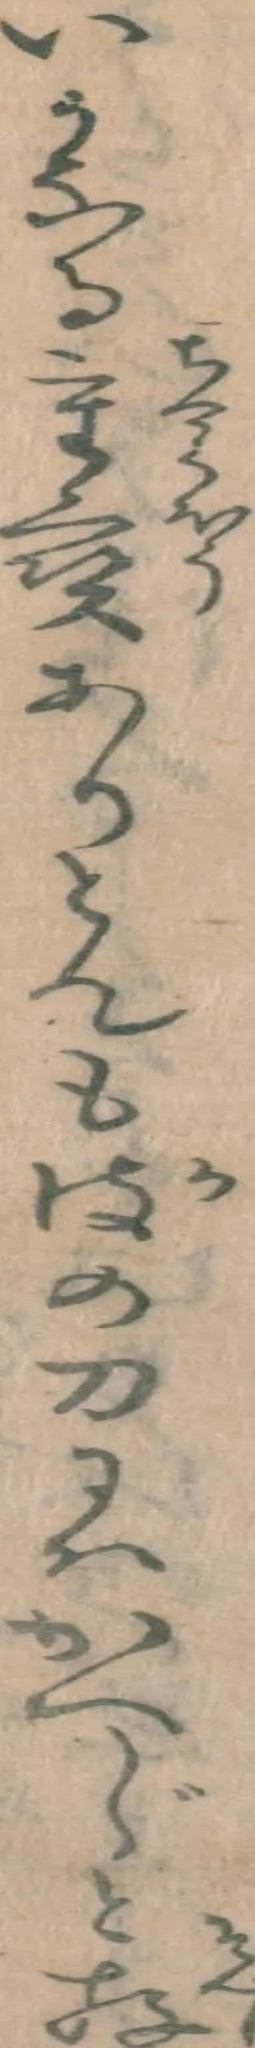いかなる重宝ありとても彼の刀にはかへじと存
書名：怪談御伽童 5巻. [2]
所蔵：国立国会図書館 National Diet Library, JAPAN
